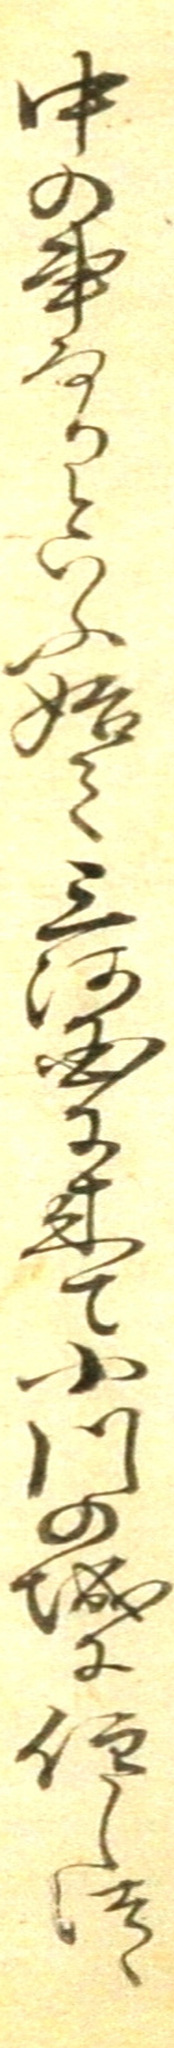中の事なりといふ始て三河国にきて小川の城に住しつゝ

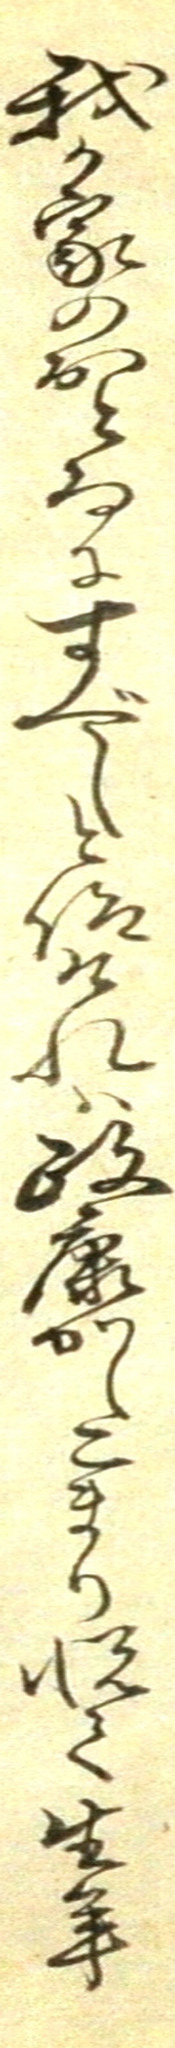我か家のおとなにすべしと仰けれは政康かしこまり悦て生年
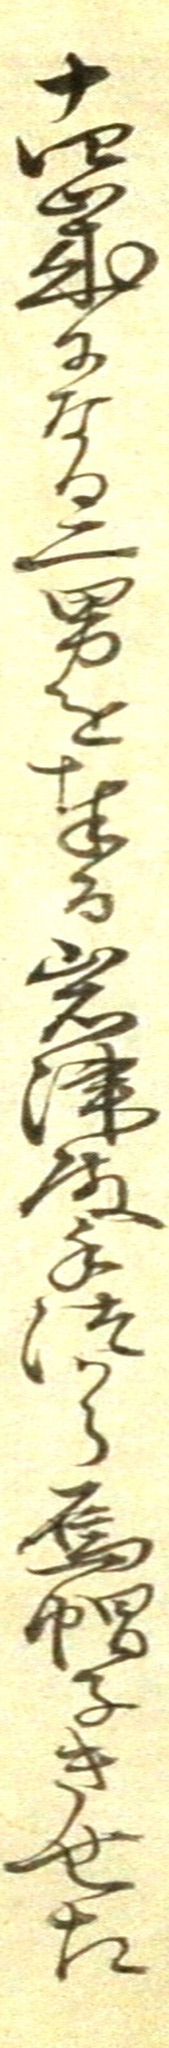十四歳になる二男を奉る岩津殿手つから烏帽子きせ左
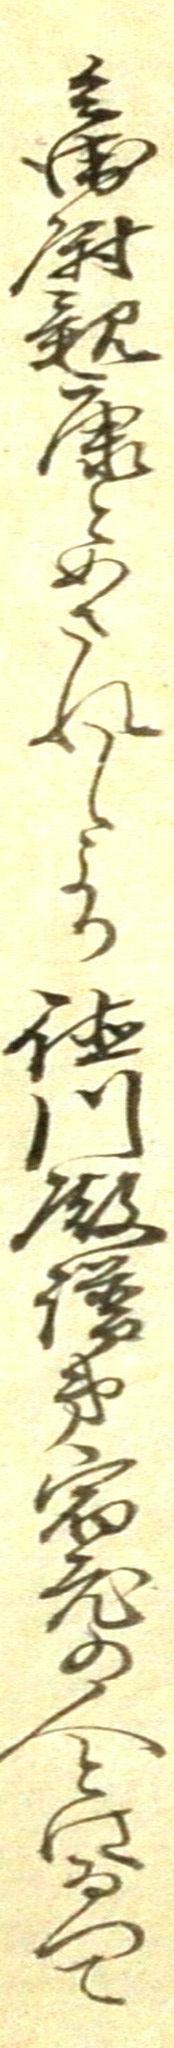兵衛尉親康とめされしより徳川殿譜第宿老の人とはなつて
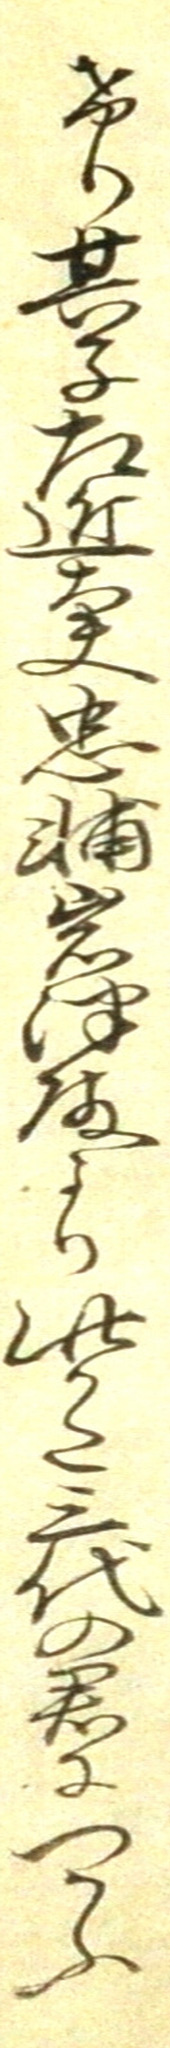けり其子左近大夫忠輔岩津殿より此かた三代の君につかふ
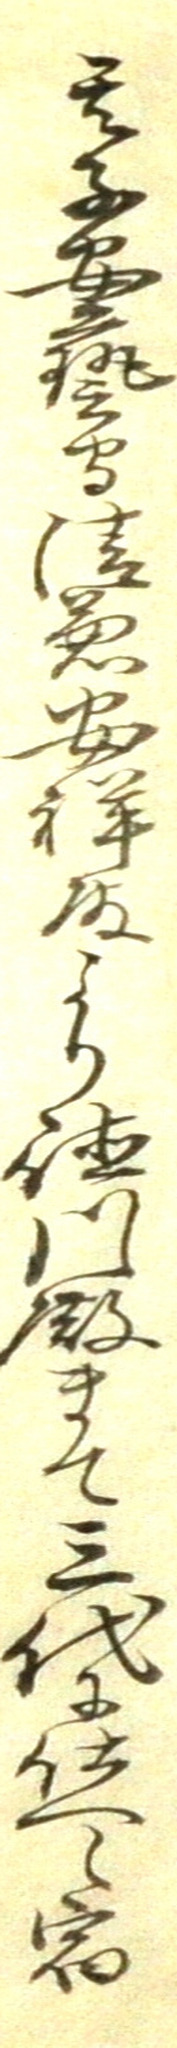其子安芸守清兼安祥殿より徳川殿まて三代に仕へし宿
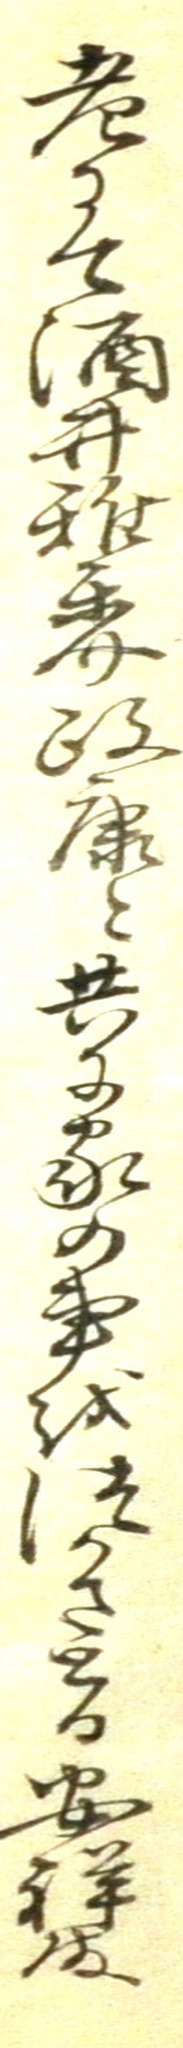老にて酒井雅楽介政康と共に家の事をつかさとる安祥殿
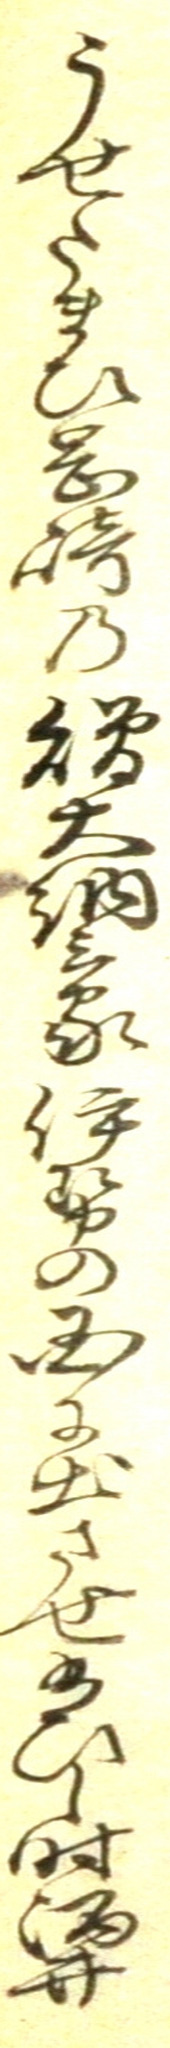うせたまひ岡崎の贈大納言家伊勢の国に出させ給ひし時酒井
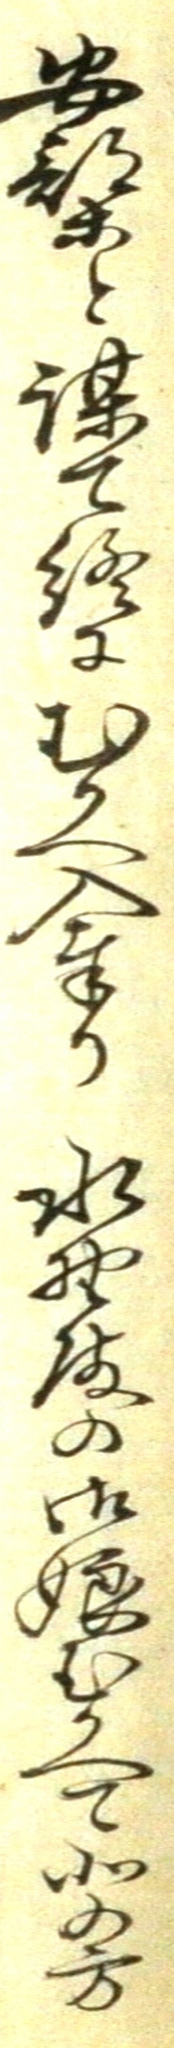安部等と謀て終にむかへ入奉り水野殿の御娘むかへて北の方
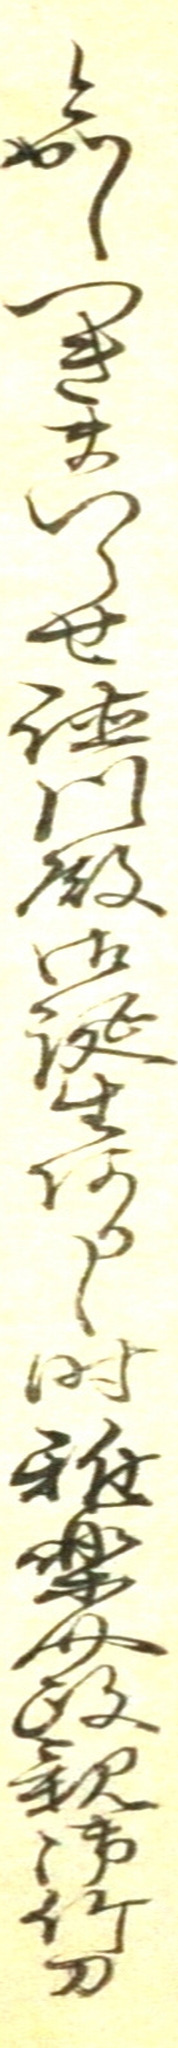とかしつきまいらせ徳川殿御誕生ありし時雅楽介政親御竹刀
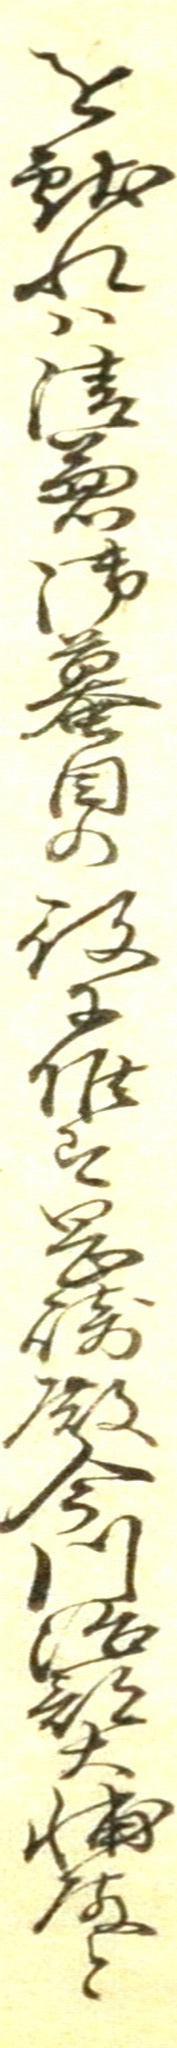を献れは清兼御蟇目の役に候す岡崎殿今川治部大輔殿と
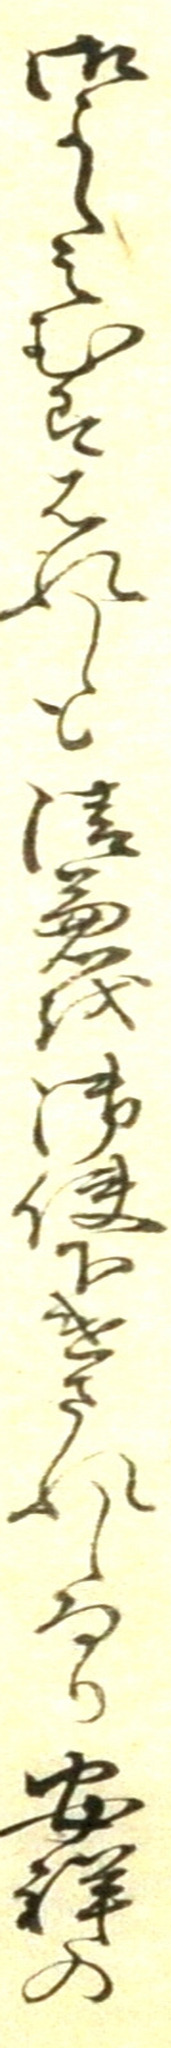御よしみむすはれしも清兼を御使下遣されしなり安祥の
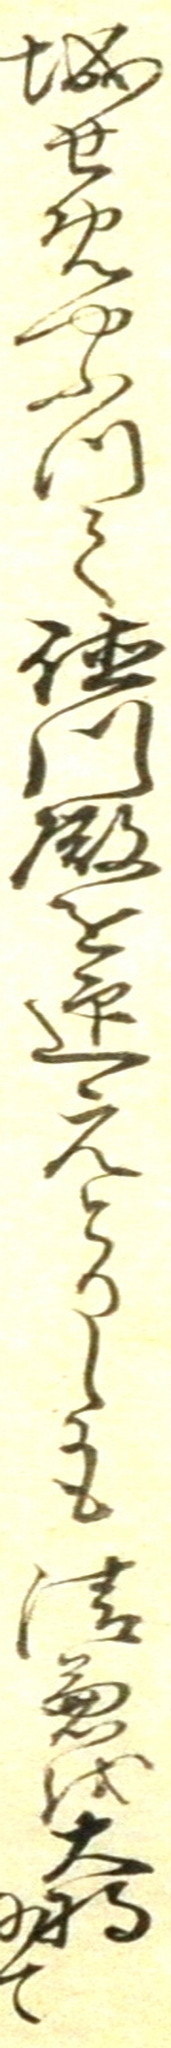城せめやふつて徳川殿を迎えとりしにも清兼を大将にて
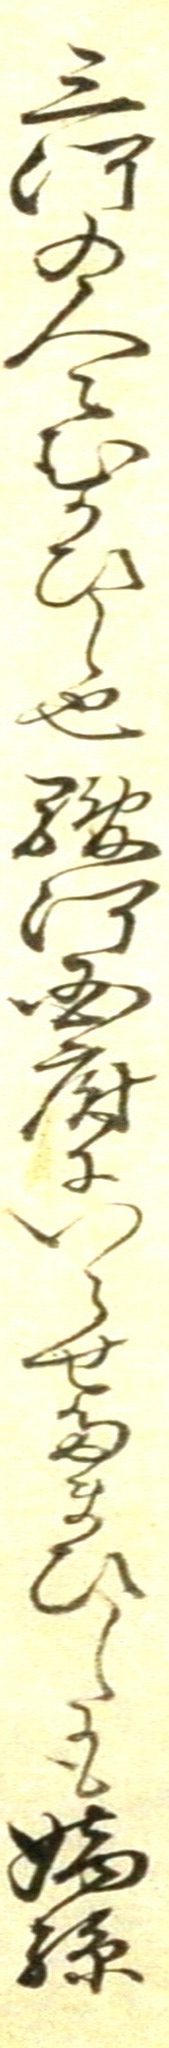三河の人々むかひし也駿河国府にいらせたまひしにも嫡孫
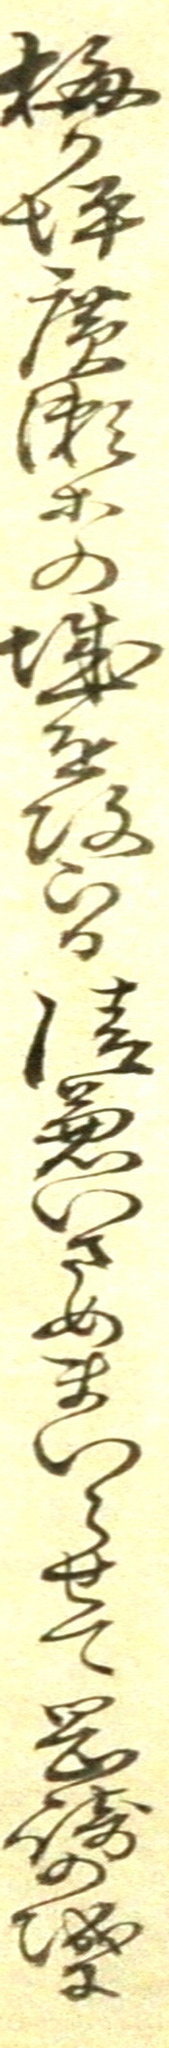梅か坪廣瀬等の城を攻らる清兼いさめまいらせて岡崎の城に
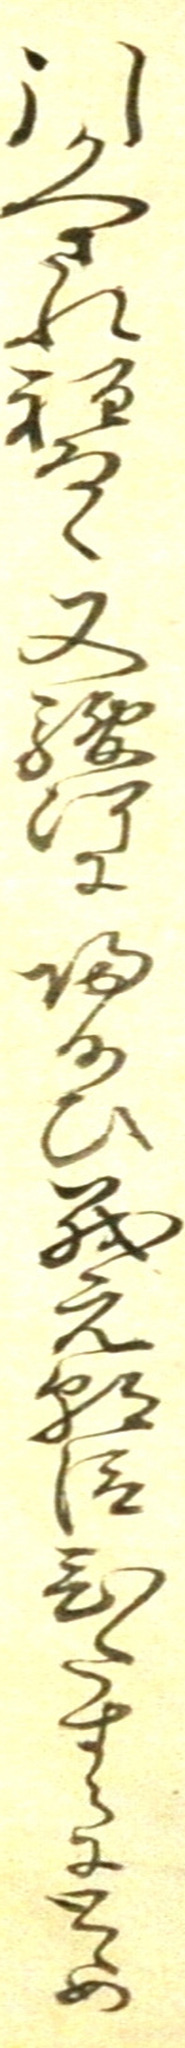引かへされ程なく又駿河に帰給ひ義元朝臣ひたすらにとゝめ
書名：藩翰譜（四・中）
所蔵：伊那市立高遠町図書館・合同会社AMANE
